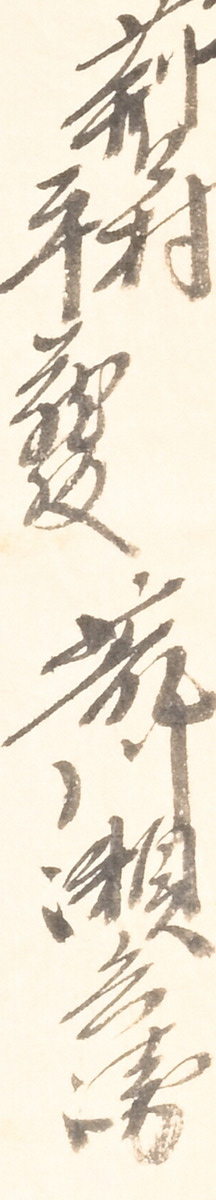平蔵殿荒川瀬兵衛
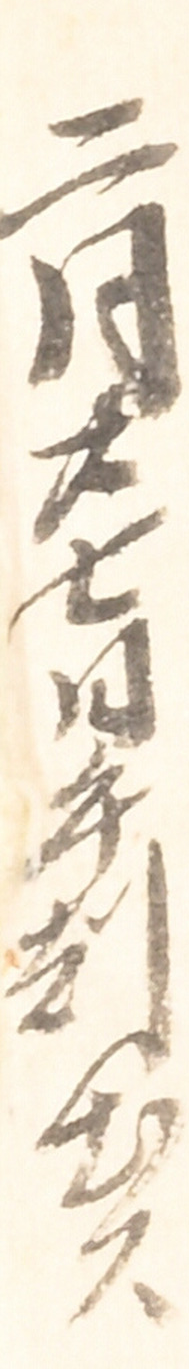二月廿七日午刻出す」

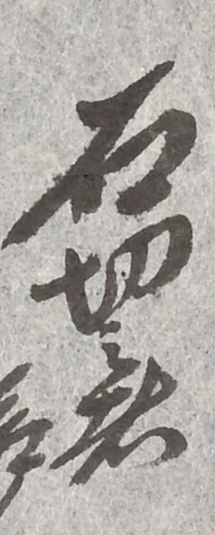石切之者
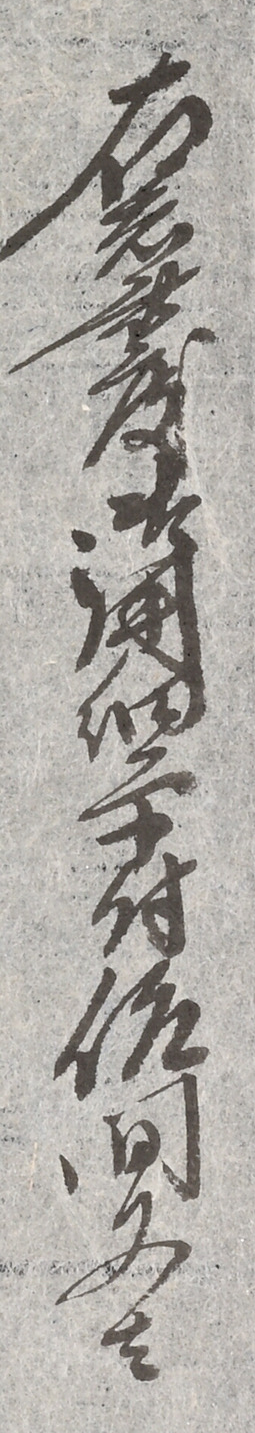右は此度御用細工申付作間又は
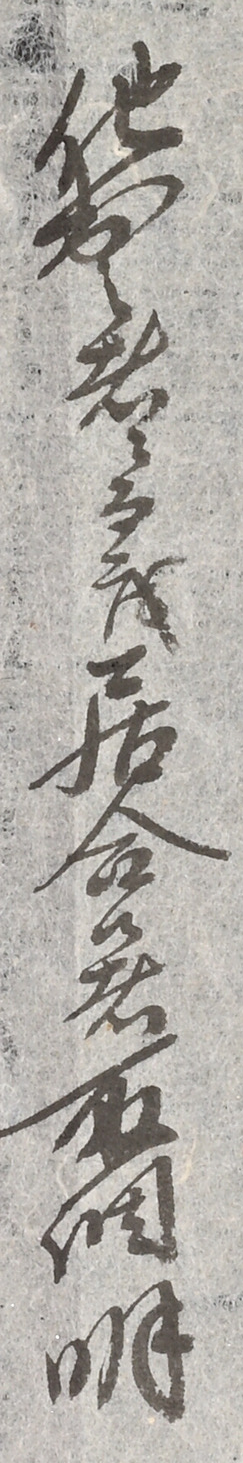他出之者にても居合候者取調明
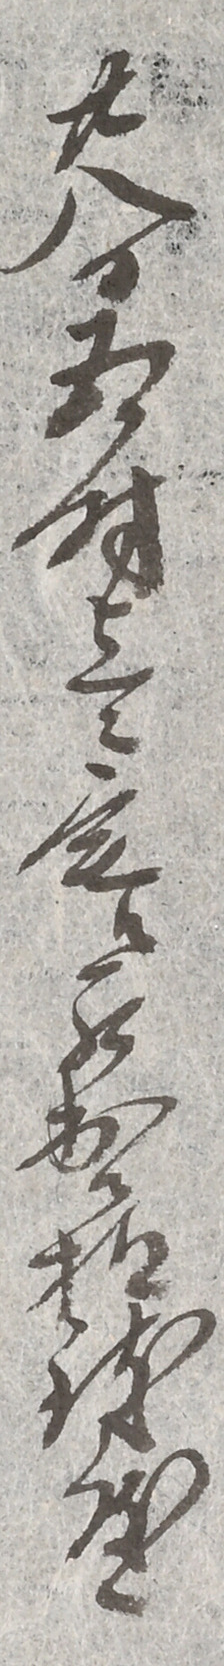廿八日五ツ時迄に宅え罷出候様致度候
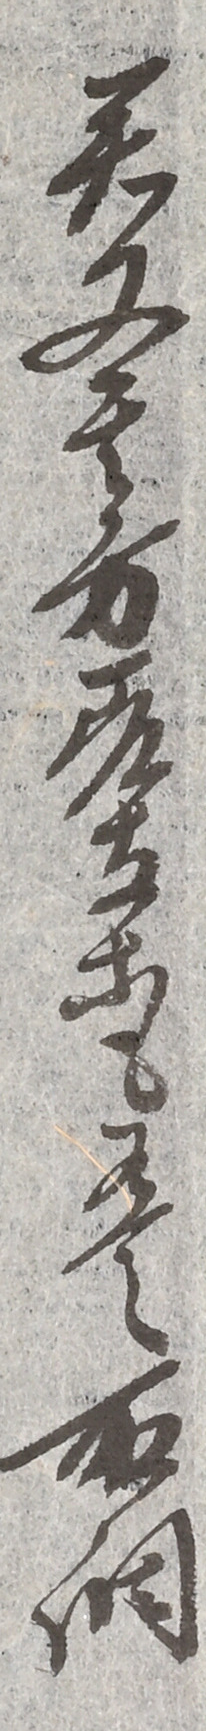若又其方差支等も有之取調
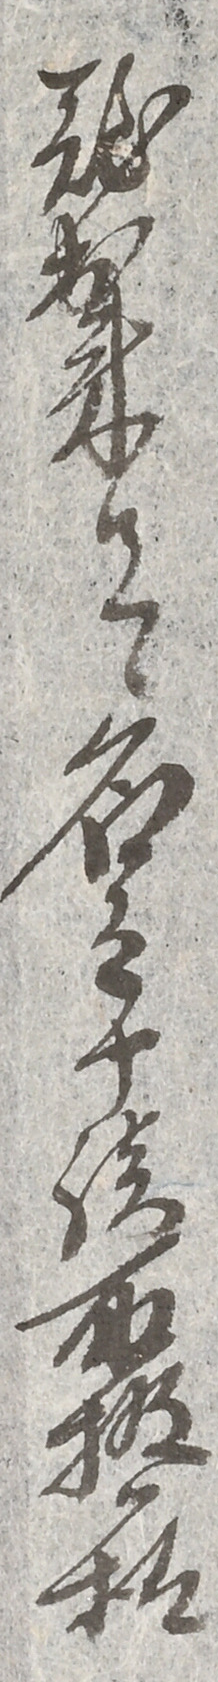難出来候はゝ名主申談取扱候様
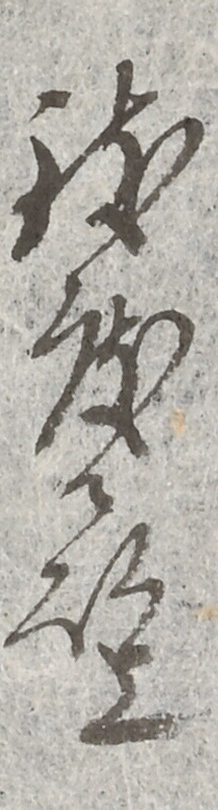致度候以上
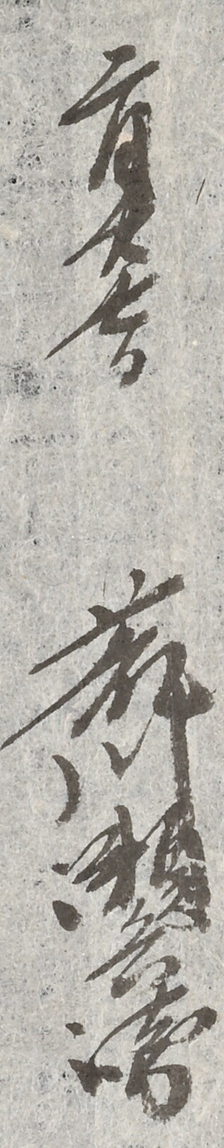二月廿七日荒川瀬兵衛
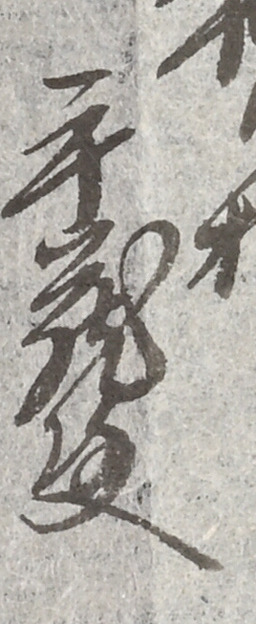平蔵殿
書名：（書状）
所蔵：伊那市立高遠町図書館・合同会社AMANE
